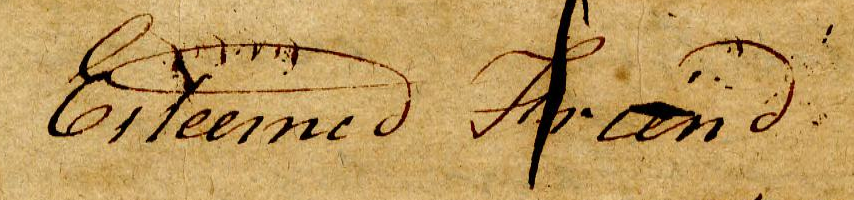Esteemed Friend
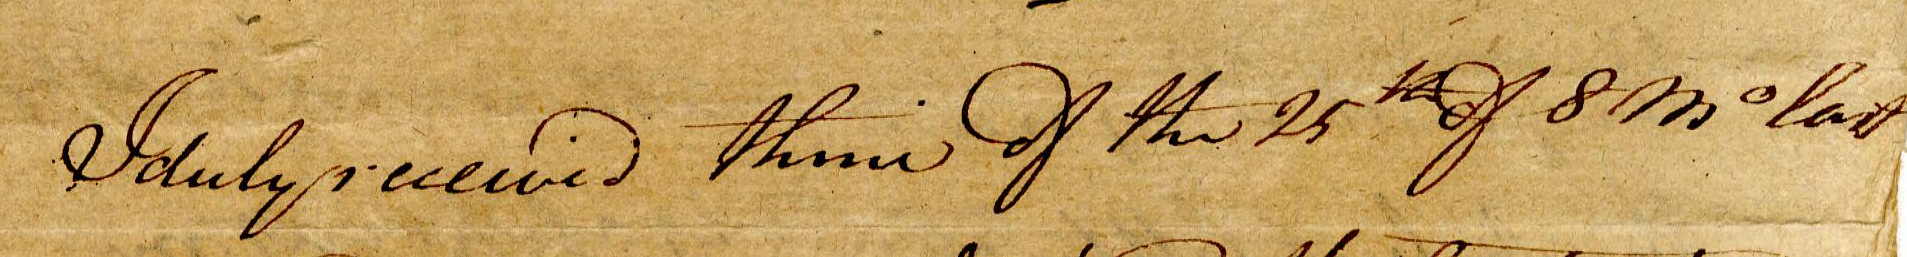I duly received thine of the 25^th of 8 m^o last
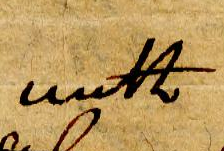with
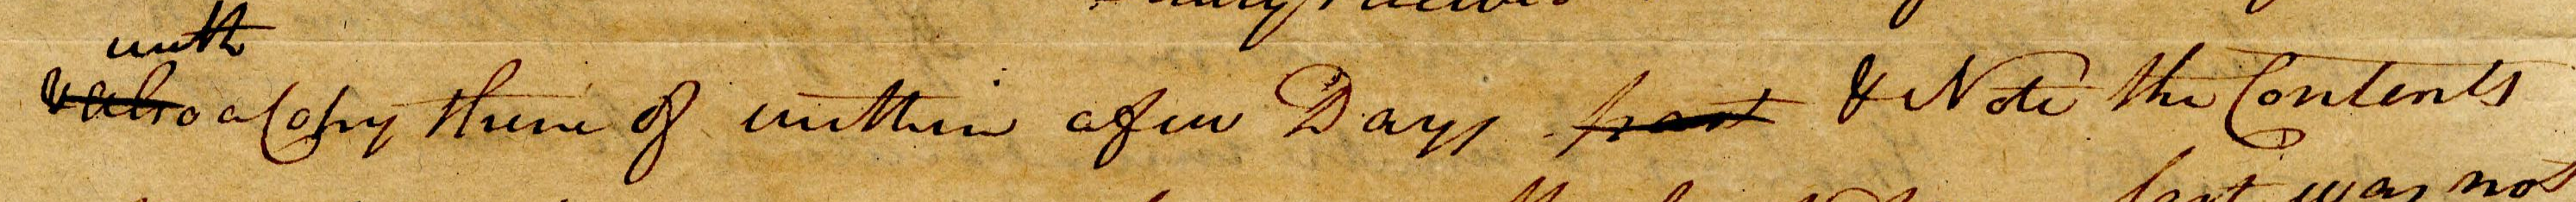[& a bro] a copy thereof within a few Days [part] & Note the Contents
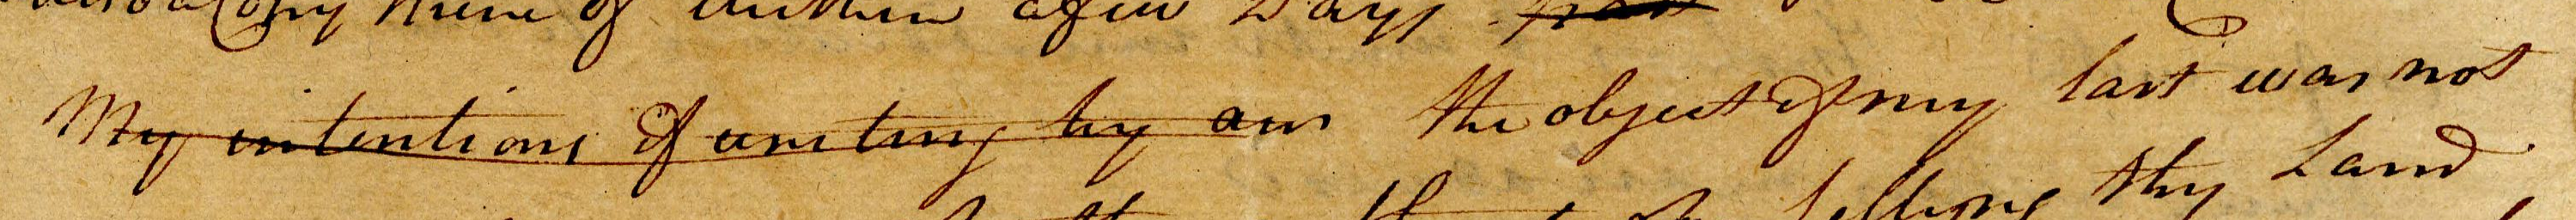[My intentions of uniting by an] the object of my last was not
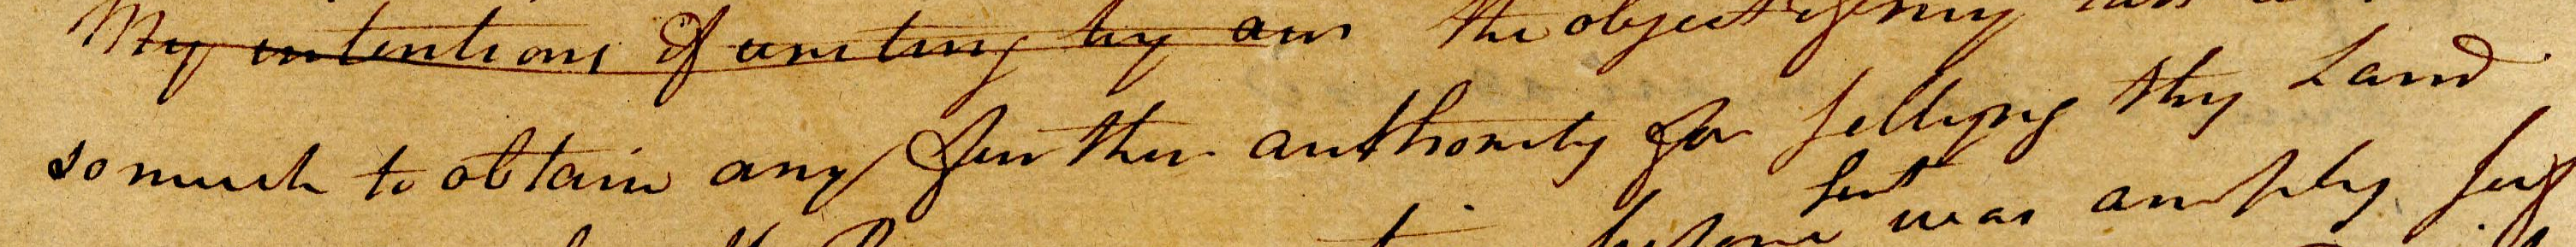so much to obtain any further authority for selling thy Land
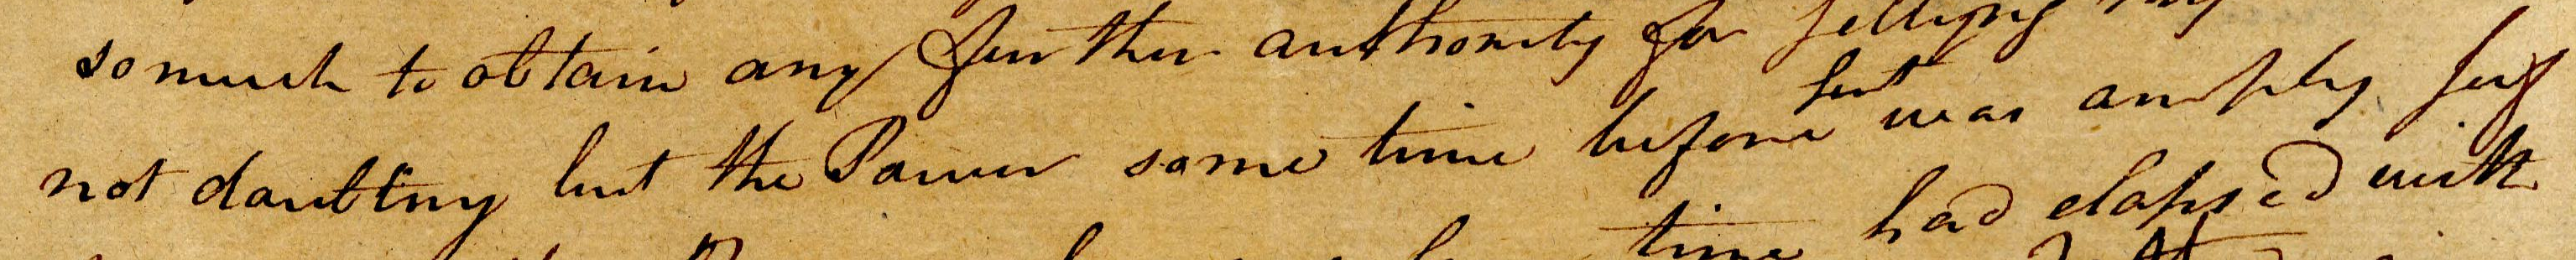not daubting but the Power sometime before sut was amply suf
